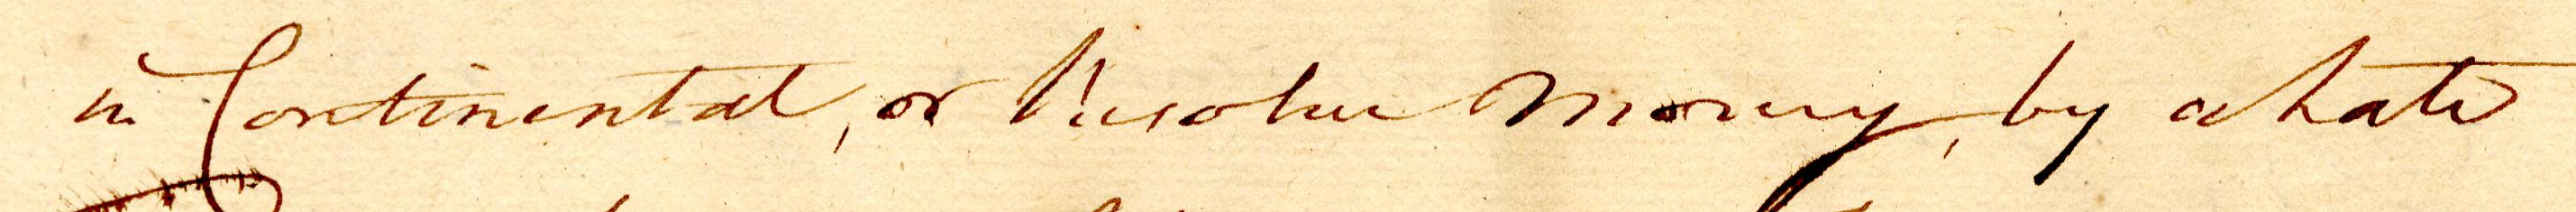in Continental, or Resolve Money, by whats
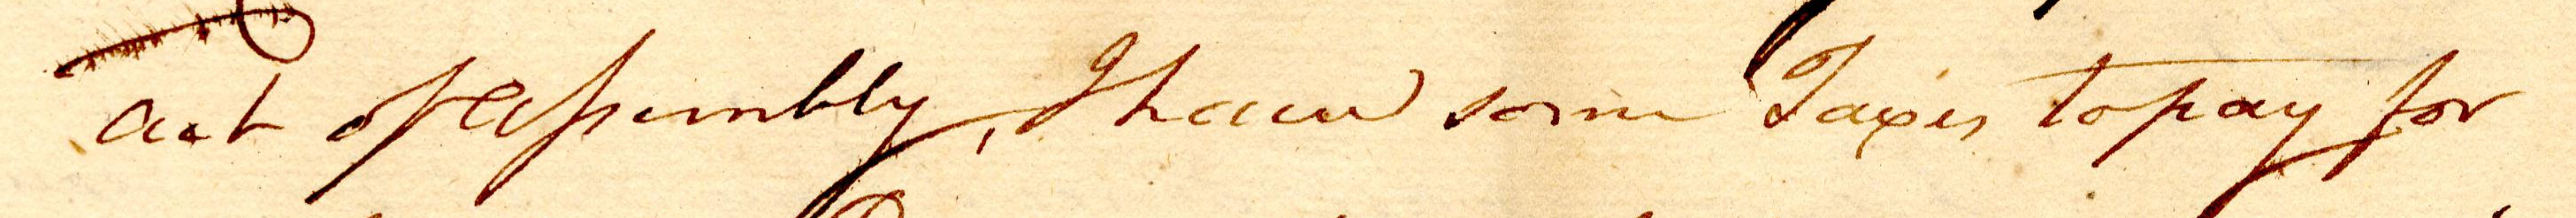act of assembly, I have some Taxes to pay for
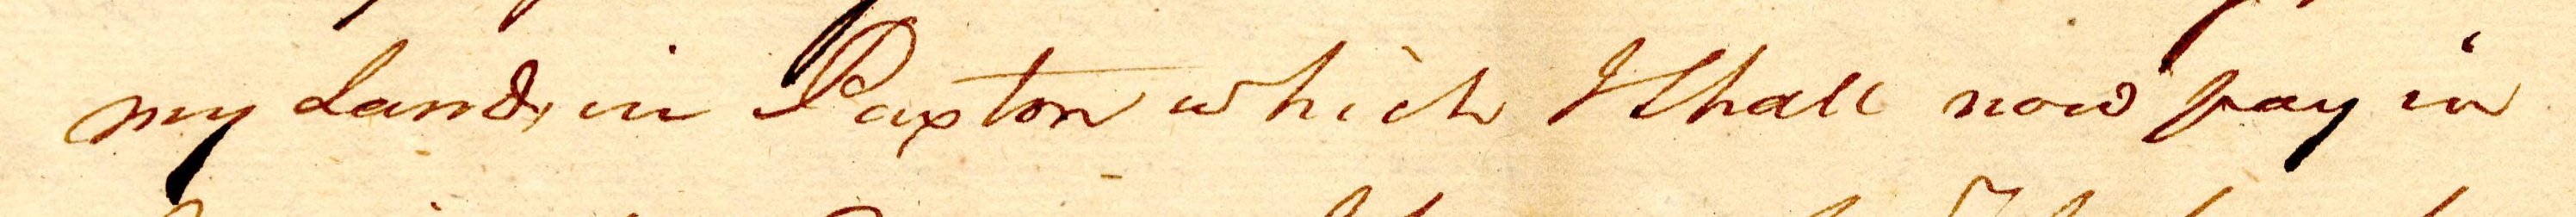my Lands in Paxton which I shall now pay in
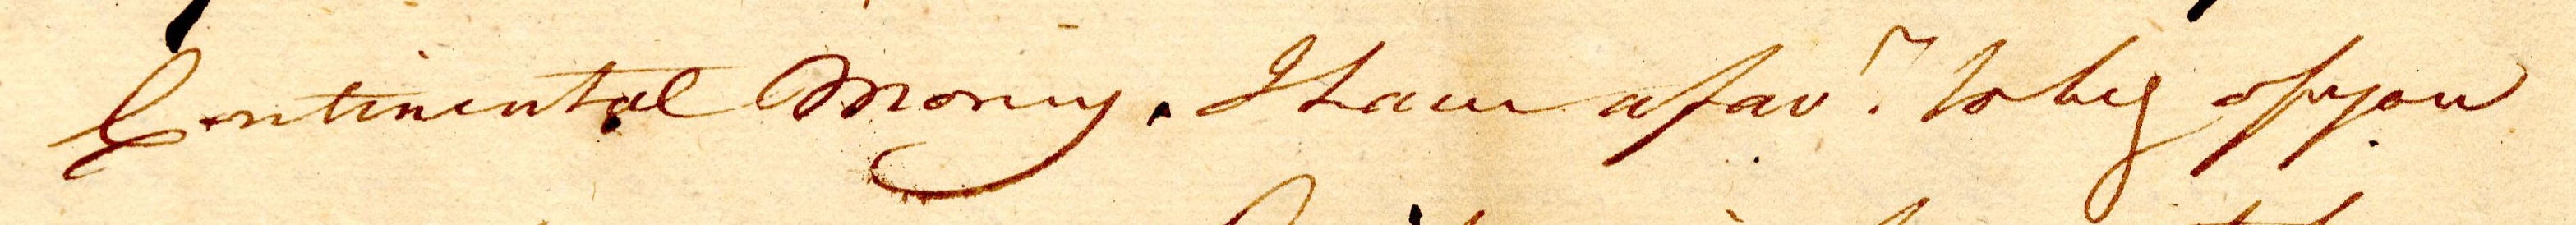Continental Money, I have a fav^r. to by of you
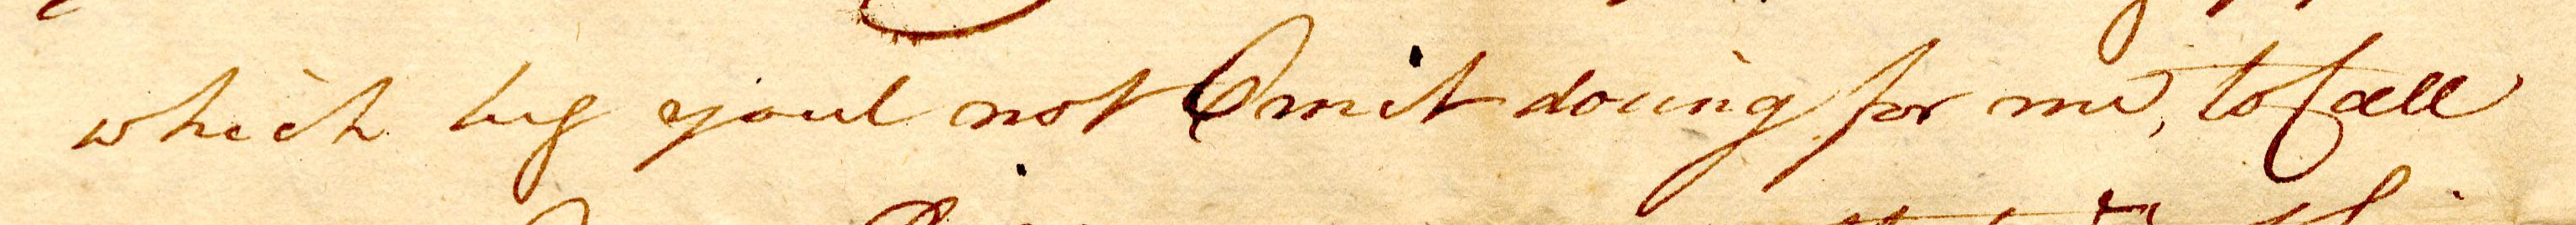which beg youl not Omit doing for me, to Call
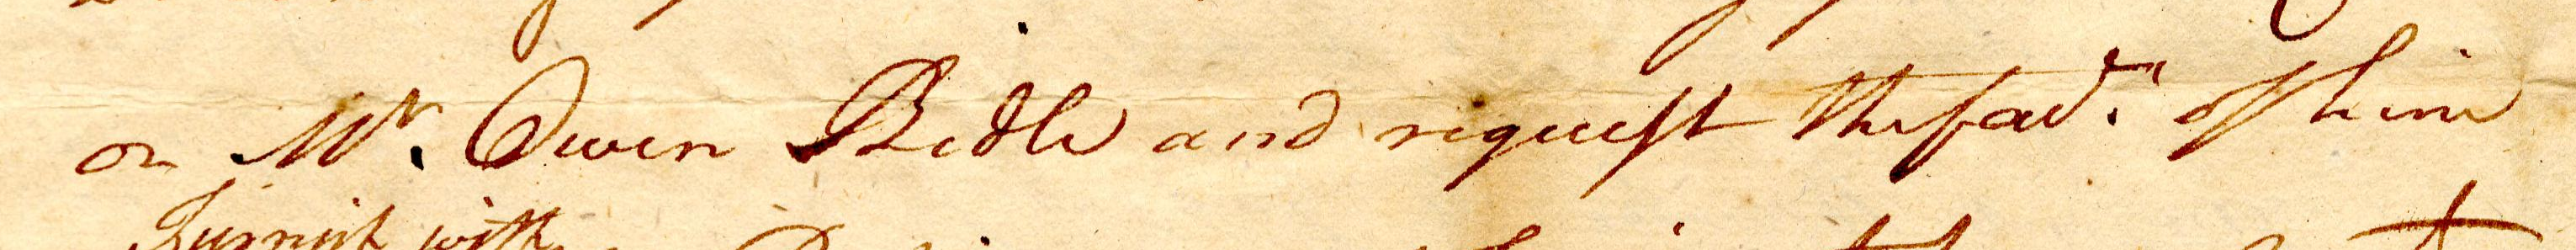on M^r. Owen Bidle and request the fav^r. of him
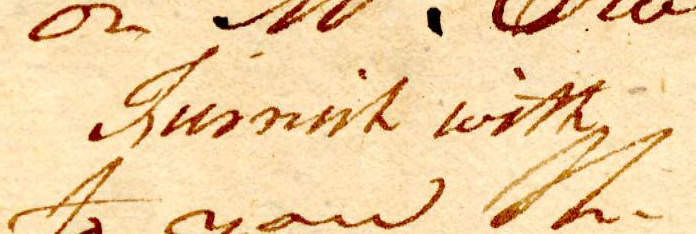Furnish with
